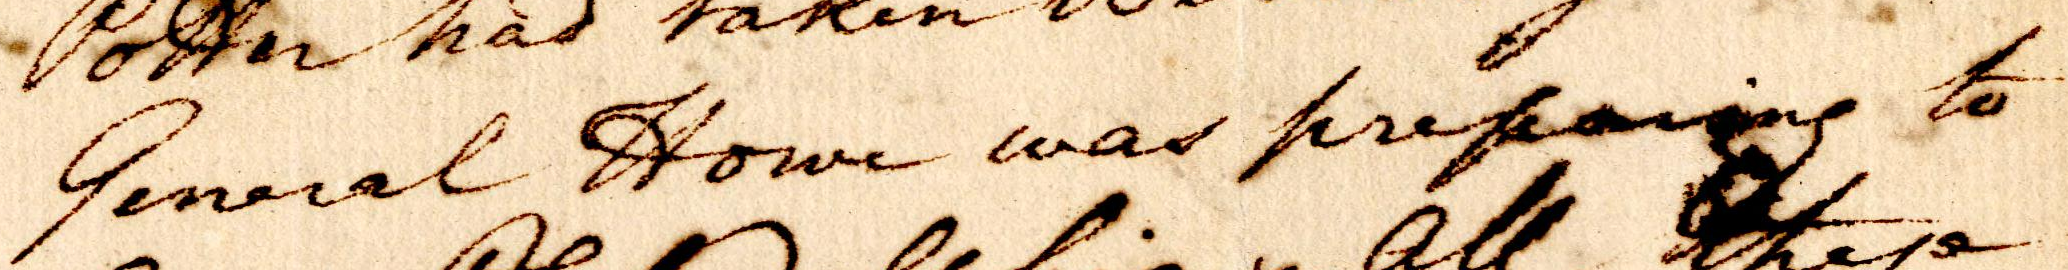General Howe was preparing to
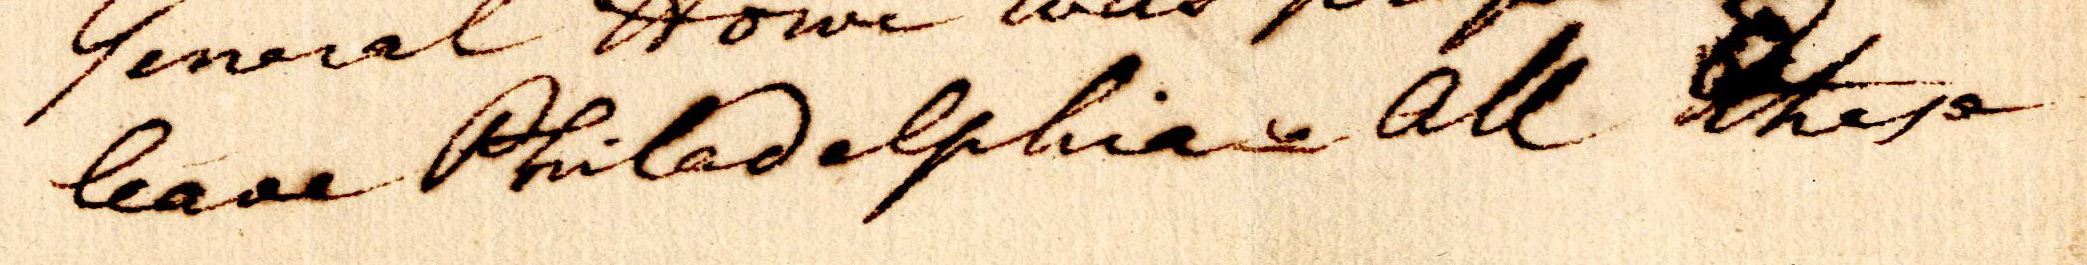leave Philadelphia- All these
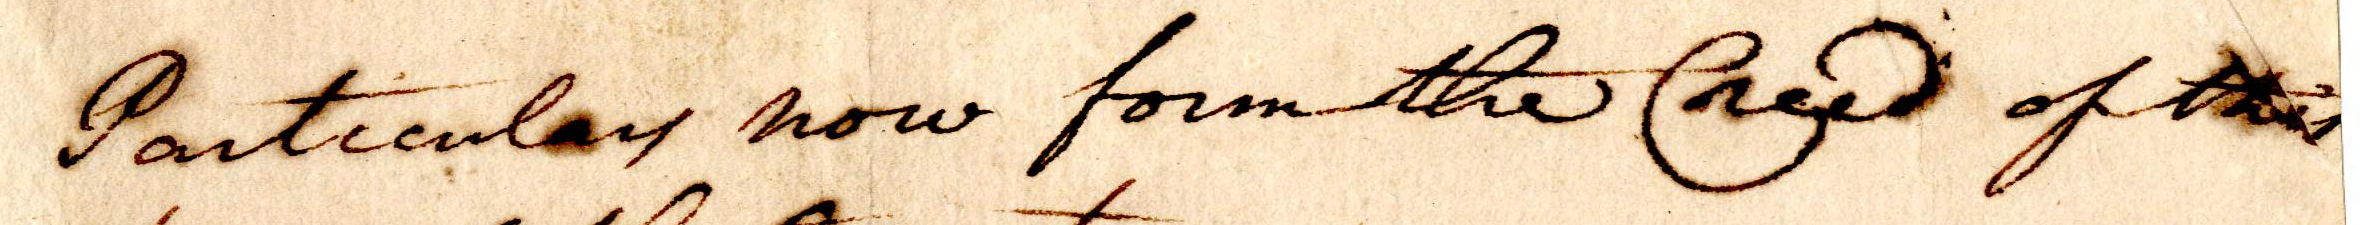Particulars now form the Creed of this
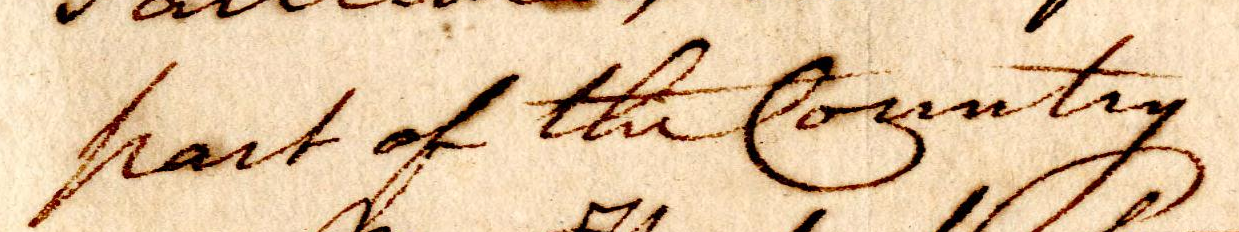part of the Country
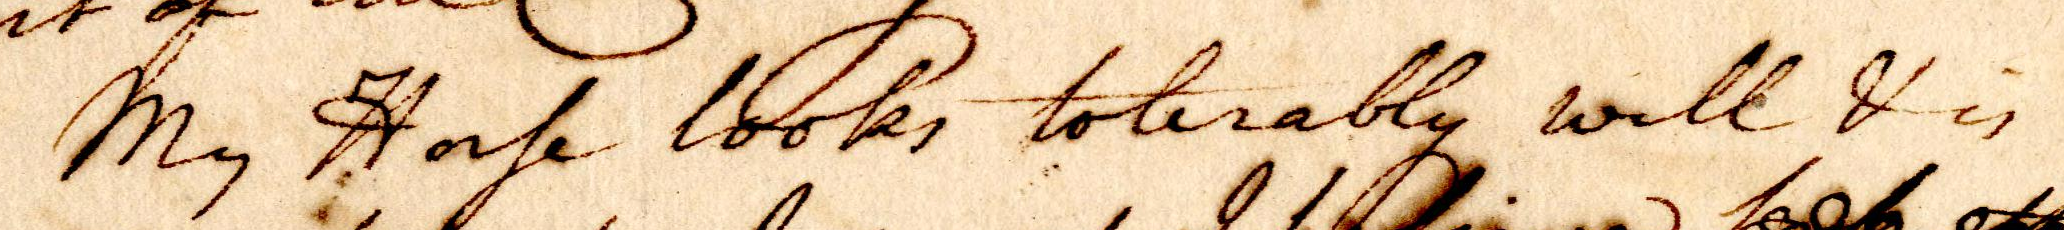My Horse looks tolerably well & is
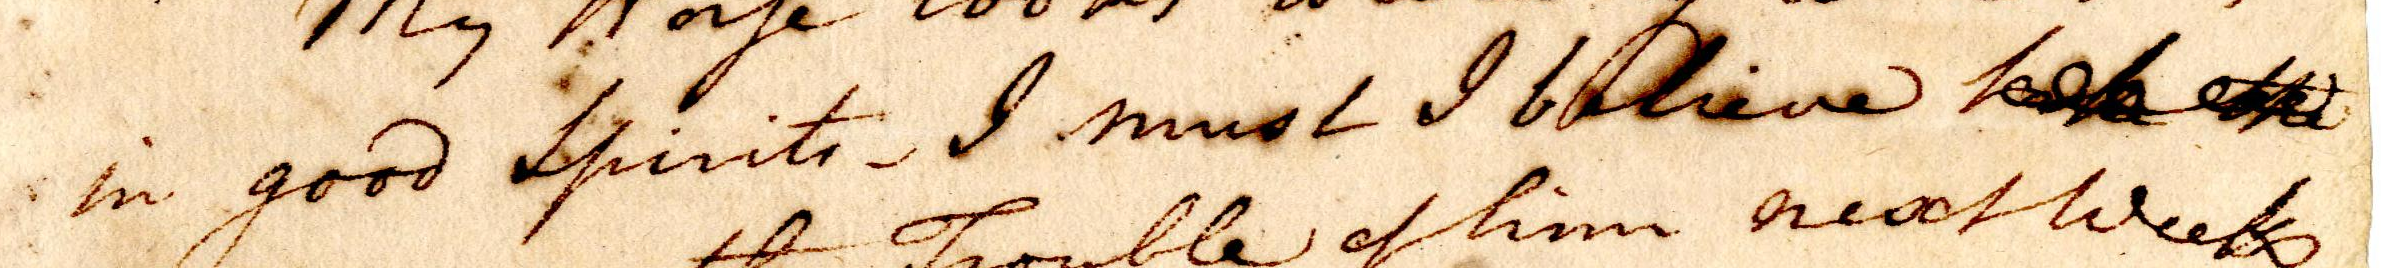in good Spirits. I must I believe [______]
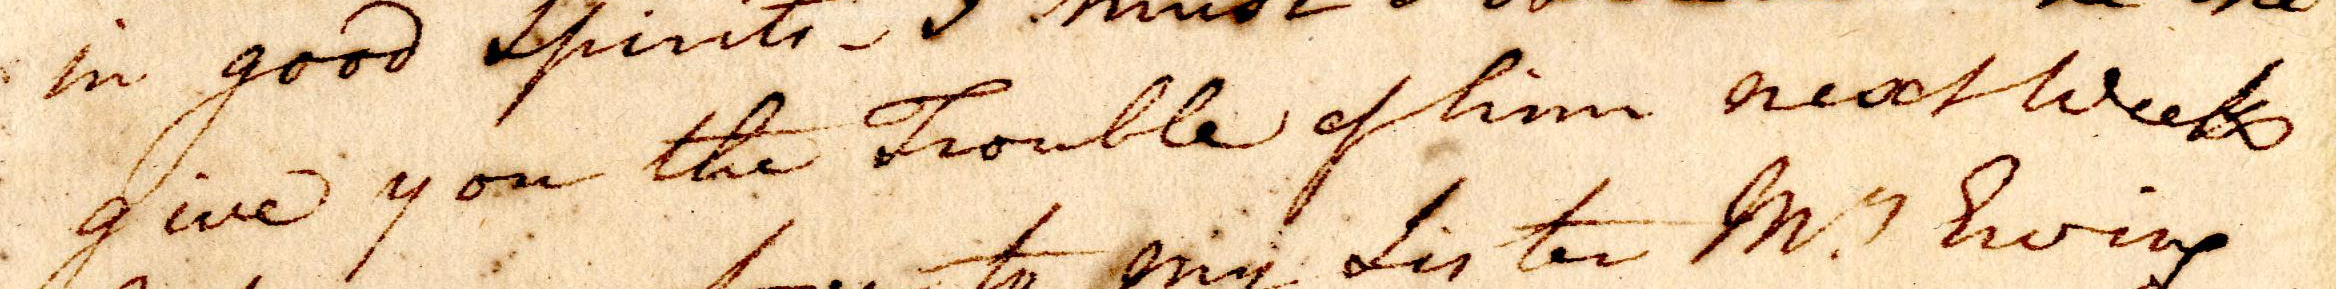give you the Trouble of him next Week
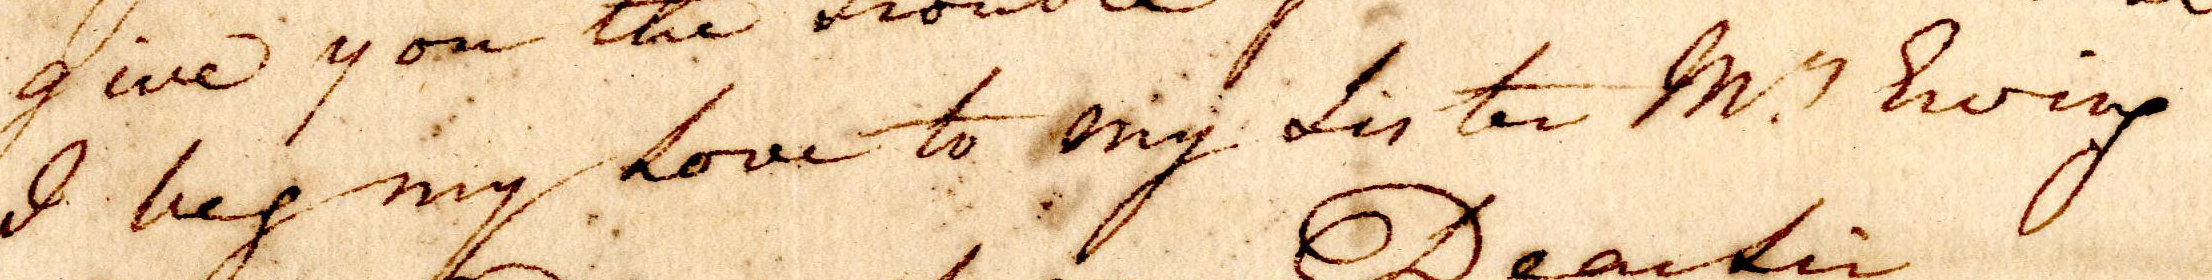I beg my Love to my Sister M^rs. Ewing
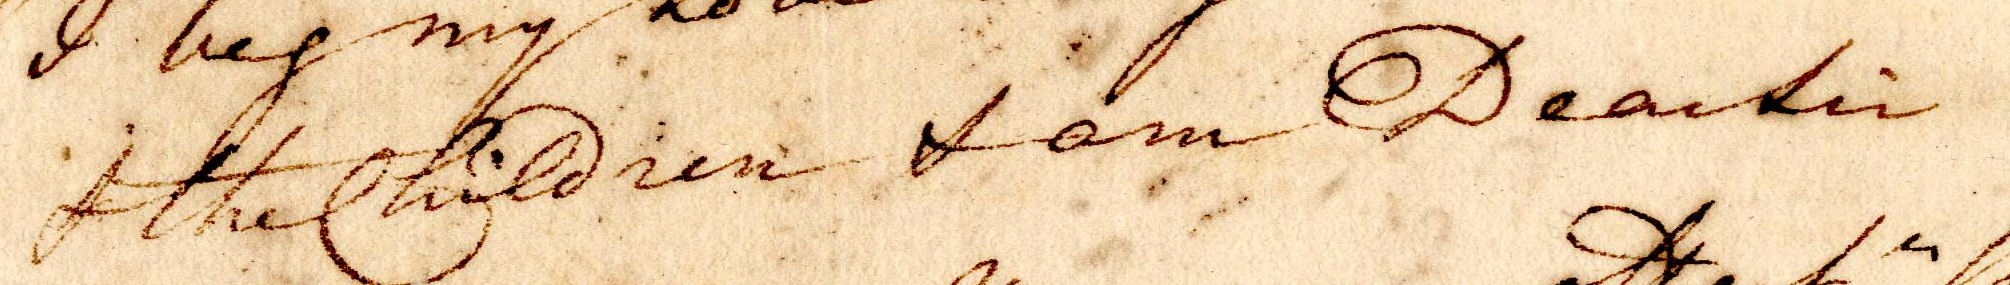& the Children & am Dear Sir
